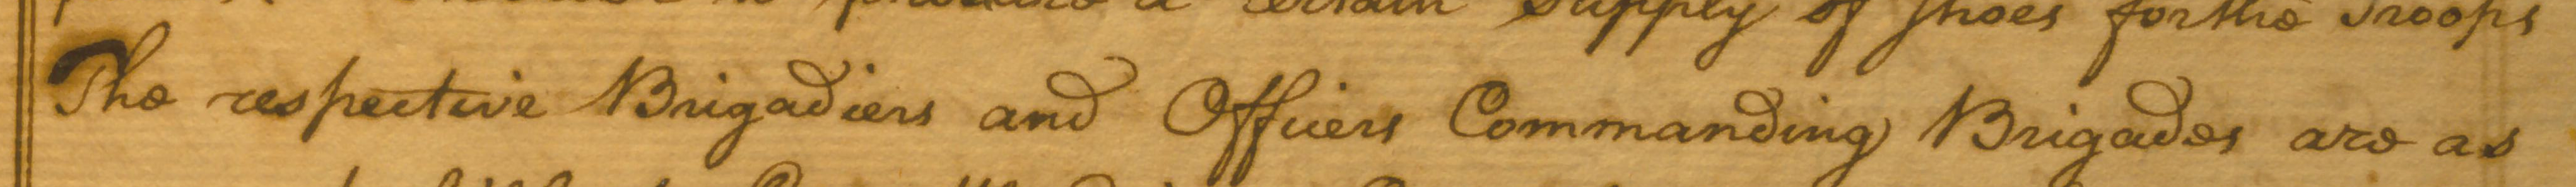The respective Brigadiers and Officers Commanding Brigades are as
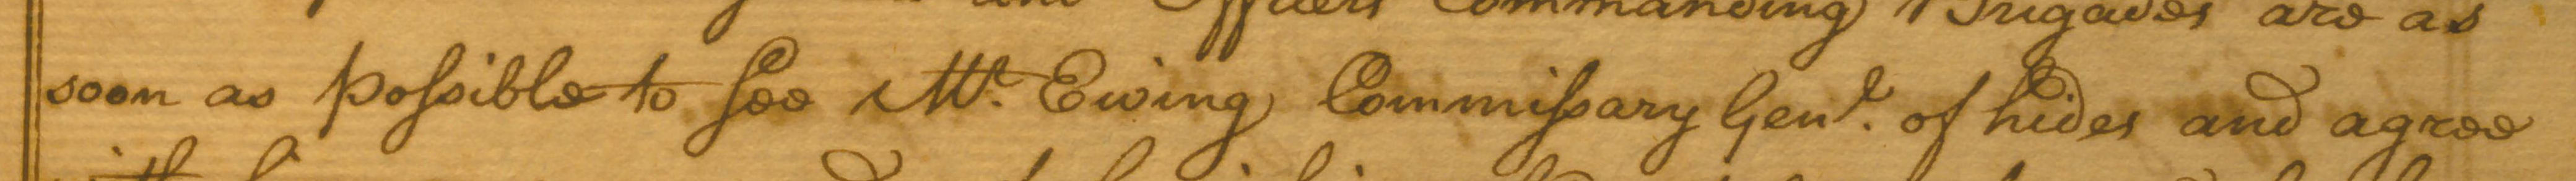soon as possible to see M^r. Ewing Commissary Gen^l. of hides and agree
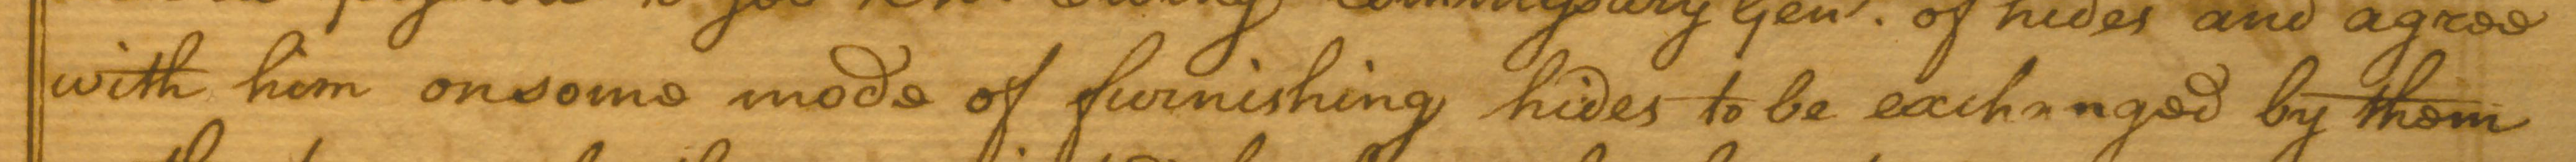with him on some mode of furnishing hides to be exchanged by them
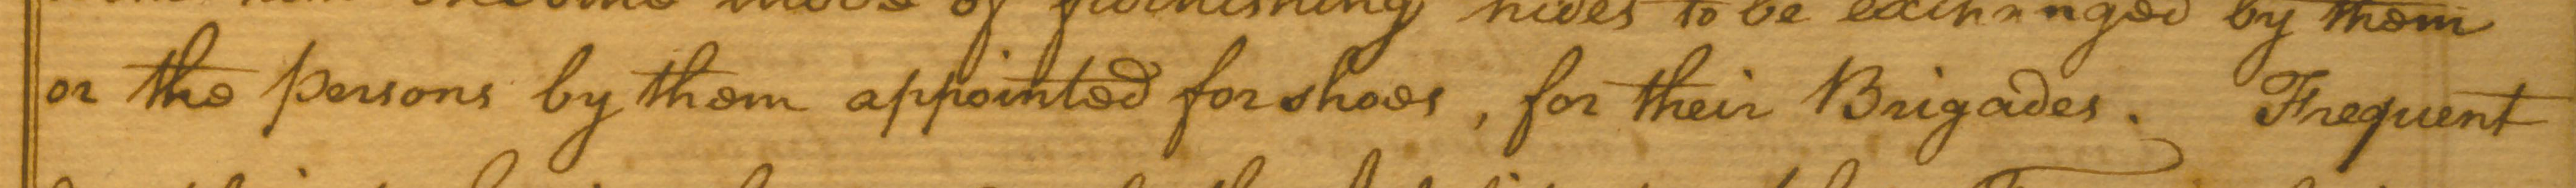or the persons by them appointed for shoes, for their Brigades. Frequent
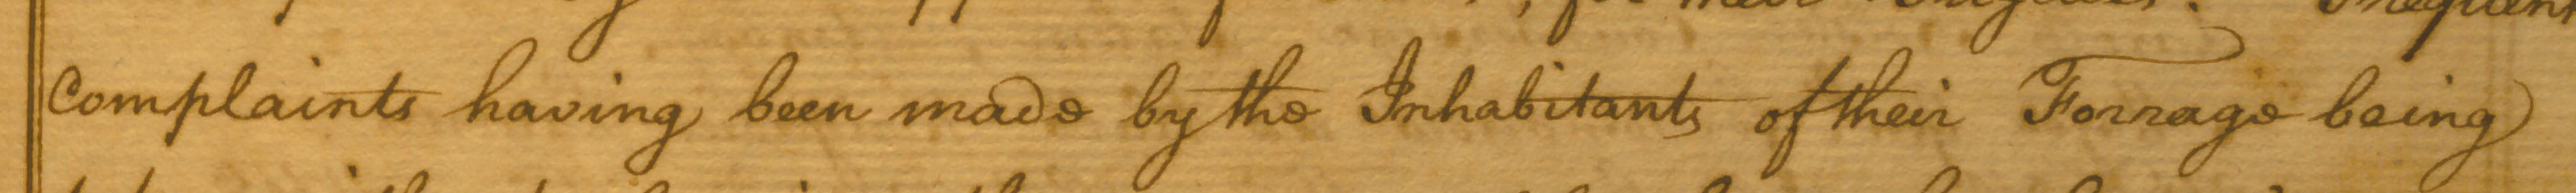Complaints having been made by the Inhabitants of their Forrage being
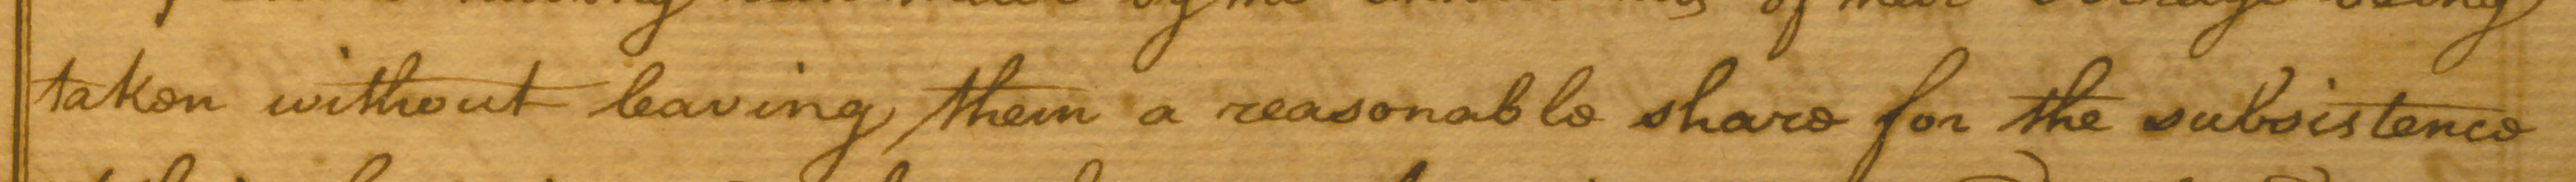taken without leaving them a reasonable share for the subsistence
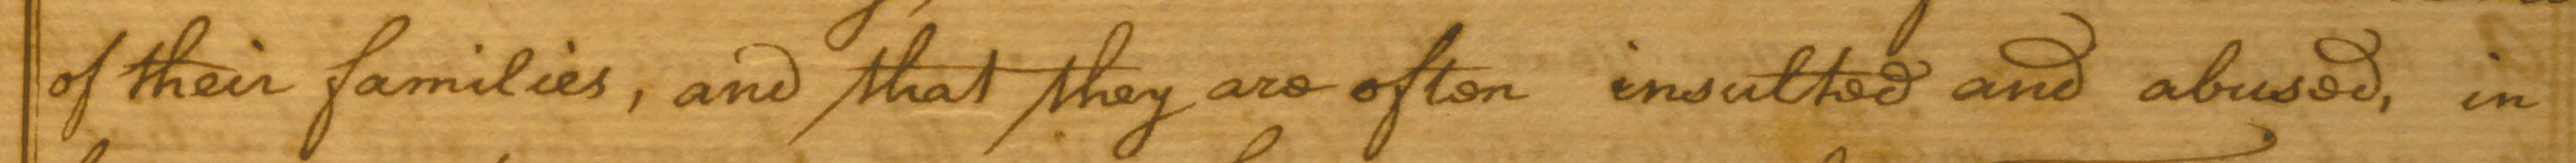of their families, and that they are often insulted and abused, in
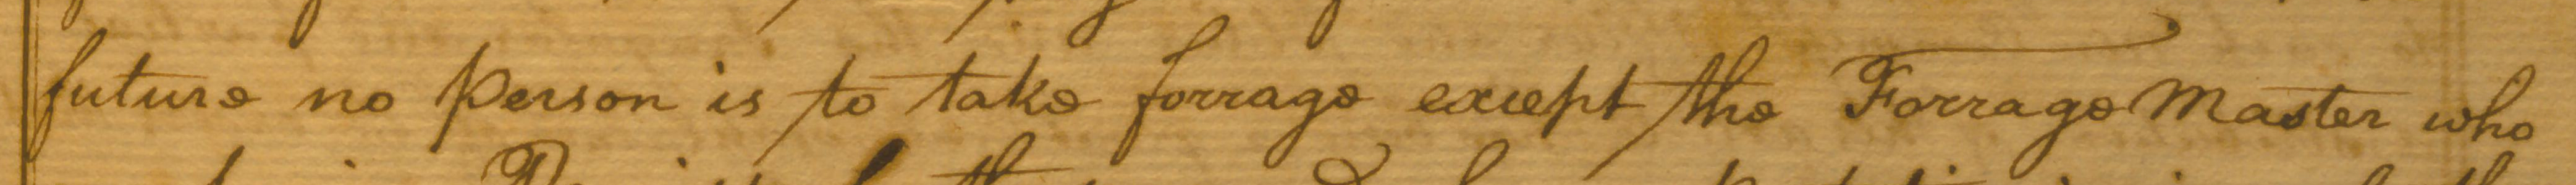future no person is to take forrage except the Forrage Master who
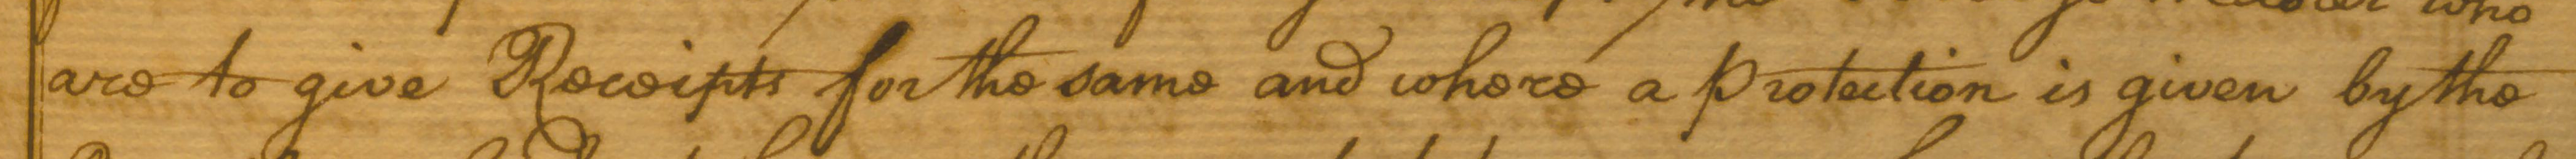are to give Receipts for the same and where a protection is given by the
